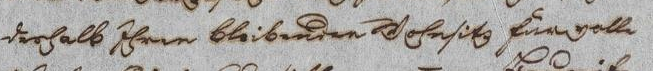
deshalb Ihren bleibenden Wohnsitz für volle
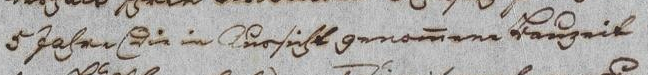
5 Jahre (die in Aussicht genommene Bauzeit
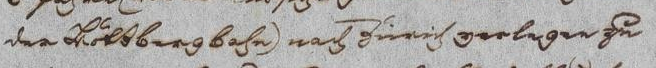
der Bötzbergbahn) nach Zürich verlegen zu
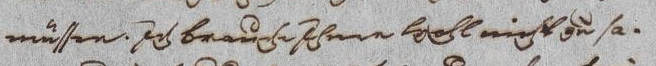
müssen. Ich brauche Ihnen wohl nicht zu sa-
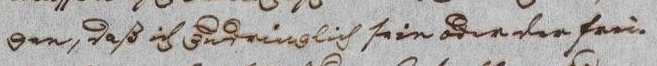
gen, daß ich zudringlich sein oder der Frei-
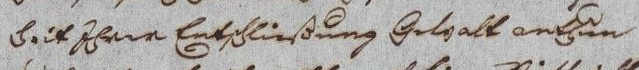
heit Ihrer Entschließung Gewalt anthun
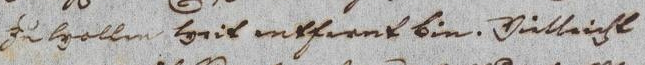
zu wollen, weit entfernt bin. Vielleicht
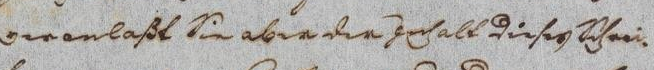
veranlaßt Sie aber der Inhalt dieses Schrei-
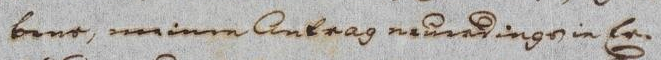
bens, meinen Antrag neuerdings in Er-
